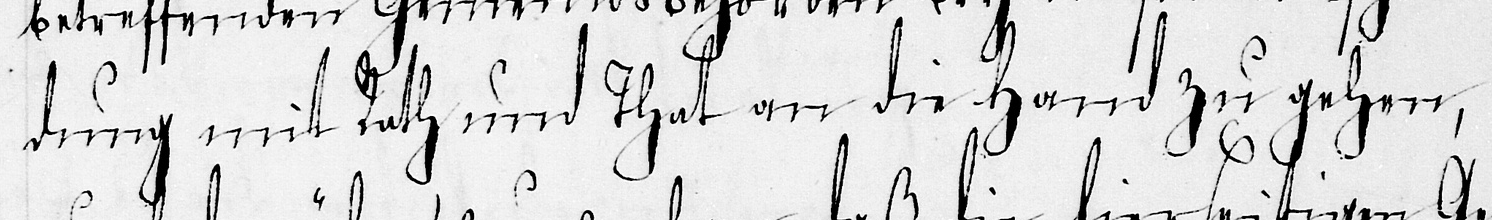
dung mit Rath und That an die Hand zu gehen,
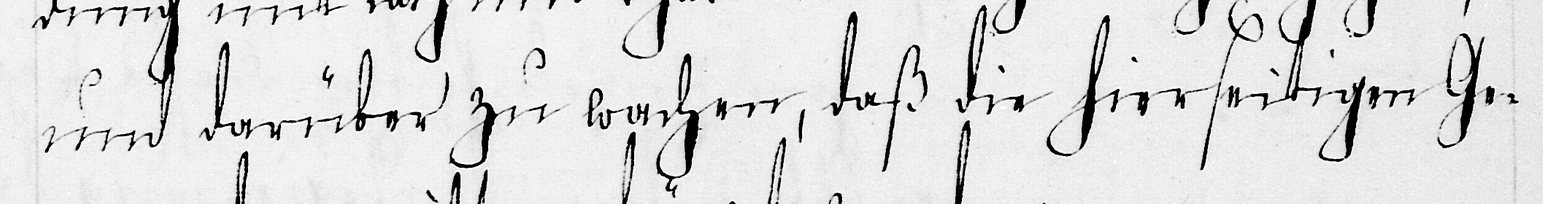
und darüber zu wachen, daß die hierseitigen Ge¬
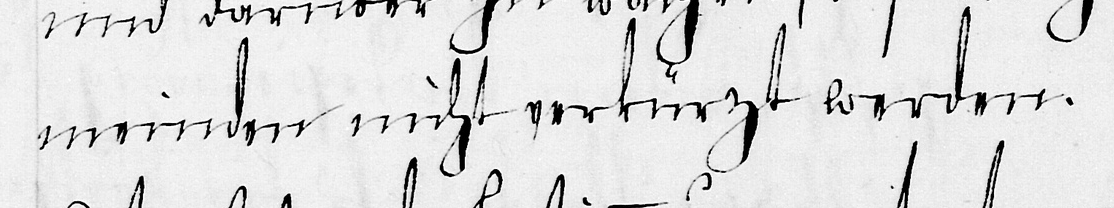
meinden nicht verkürzt werden.
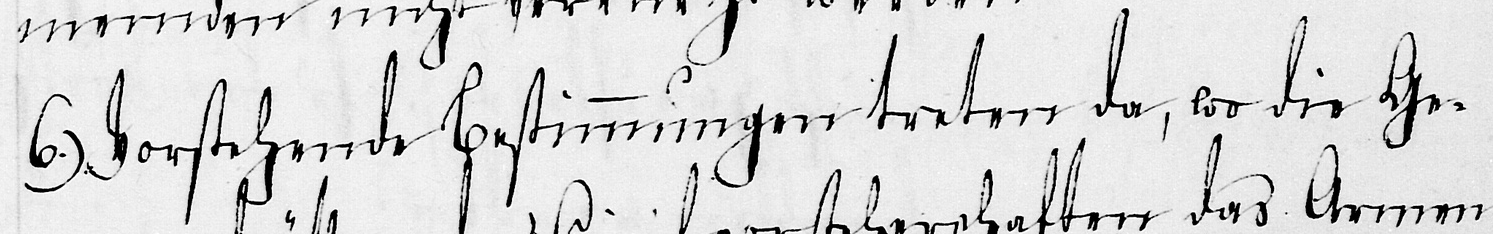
6.) Vorstehende Bestimmungen treten da, wo die Ge¬
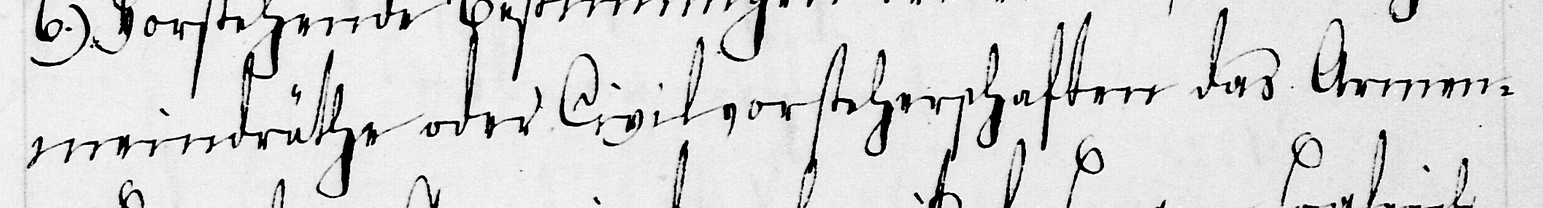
meindräthe oder Civilvorsteherschaften das Armen¬
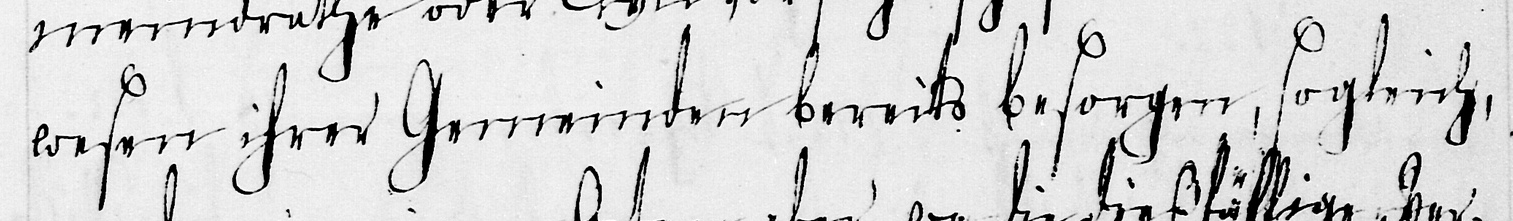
wesen ihrer Gemeinden bereits besorgen, sogleich,
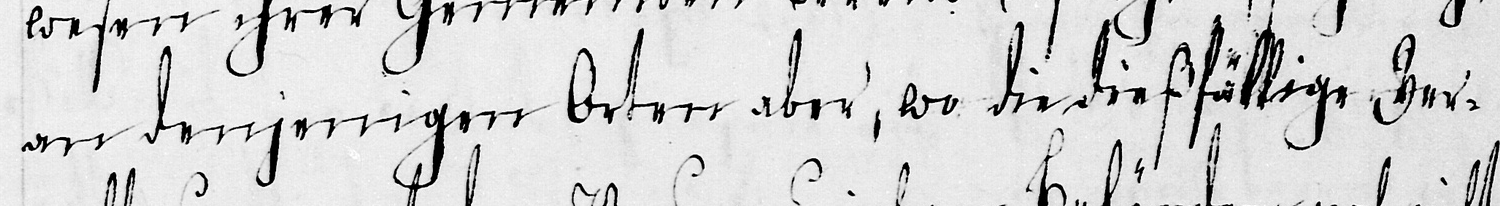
an denjenigen Arten aber, wo die dießfällige Ver¬
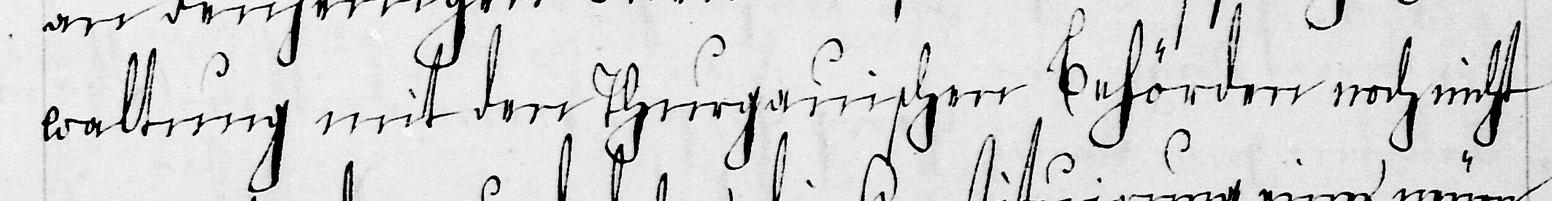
waltung mit den Thurgauischen Behörden noch nicht
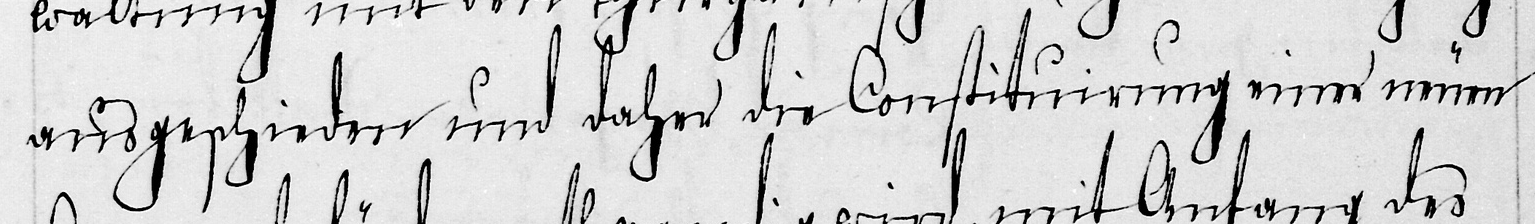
ausgeschieden und daher die Constituirung einer neuen
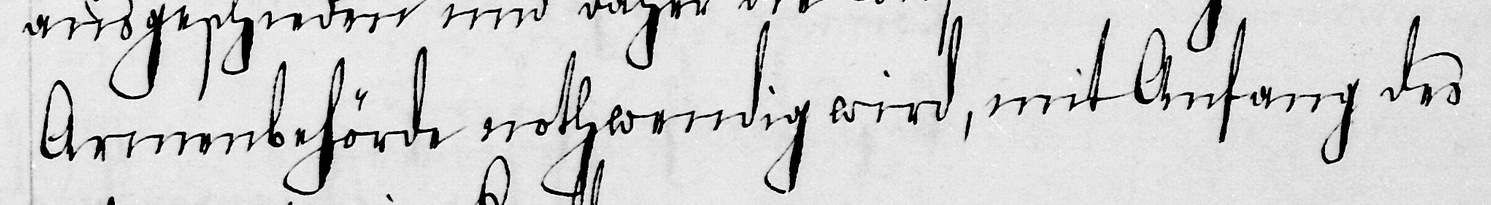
Armenbehörde nothwendig wird, mit Anfang des
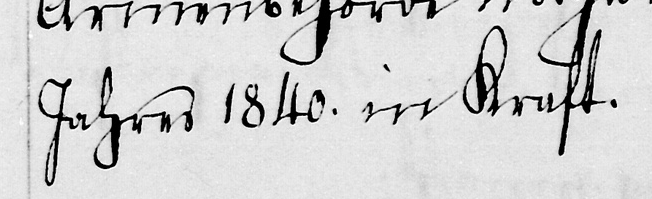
Jahres 1840. in Kraft.
